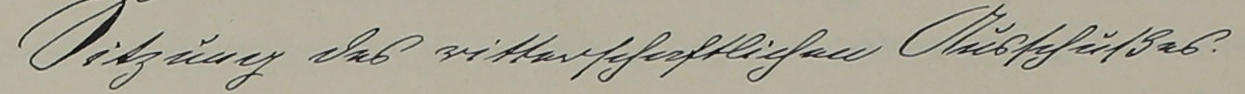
Sitzung des ritterschaftlichen Ausschußes.
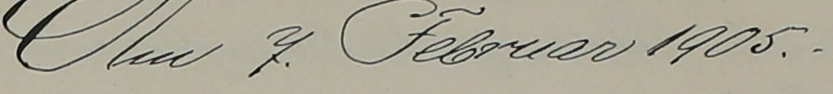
Am 7. Februar 1905.
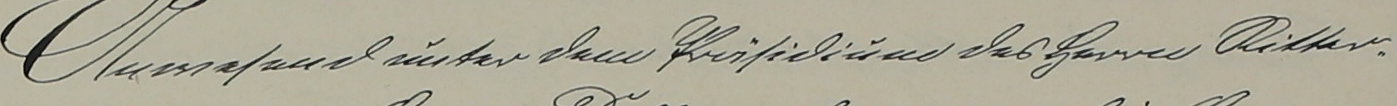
Anwesend unter dem Präsidium des Herrn Ritter-
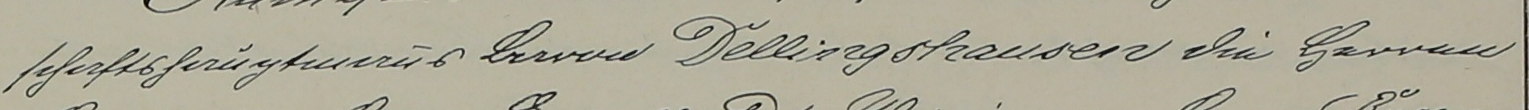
schaftshauptmanns Baron Dellingshausen die Herren
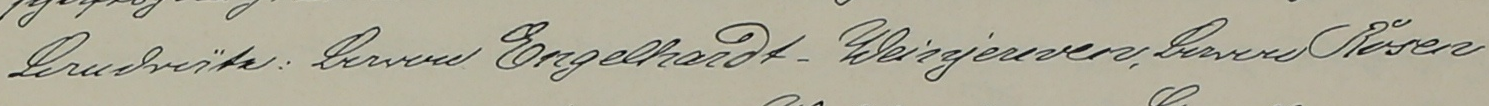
Landräte: Baron Engelhardt-Weinjerwen, Baron Rosen-
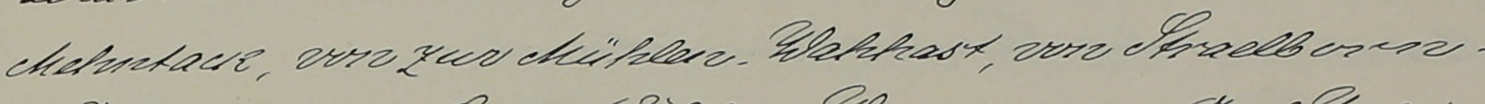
Mehntack, von zur Mühlen-Wahhast, von Straelborn-
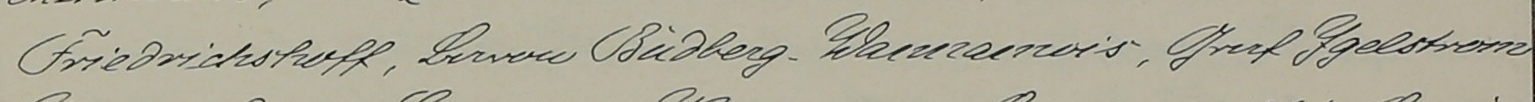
Friedrichshoff, Baron Budberg-Wannamois, Graf Igelstrom-
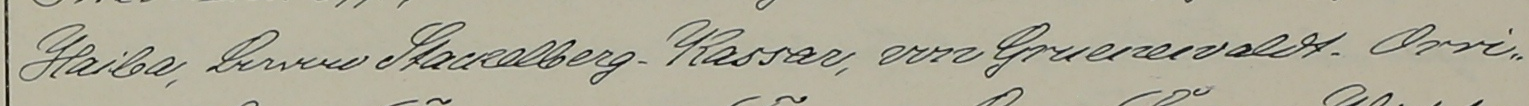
Haiba, Baron Stackelberg-Kassar, von Gruenewaldt-Orri-
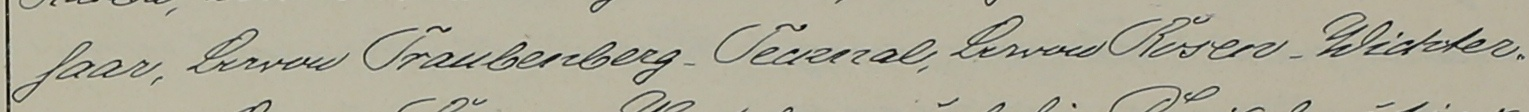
saar, Baron Traubenberg-Tecknal, Baron Rosen-Wichter-
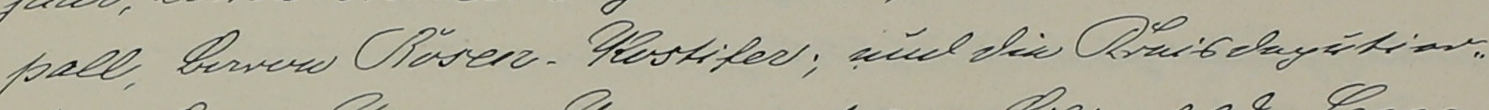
pall, Baron Rosen-Kostifer; und die Kreisdeputier-
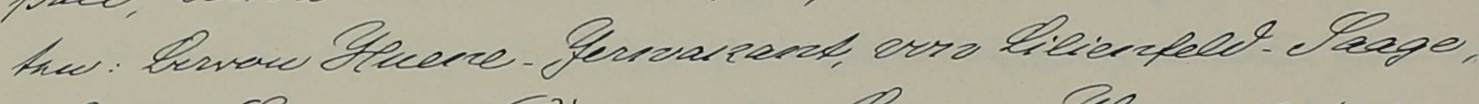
ten Baron Huene-Jerwakant, von Lilienfeld-Saage,
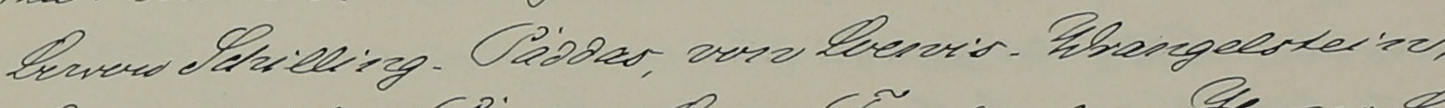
Baron Schilling-Paddas, von Loewis-Wrangelstein,
